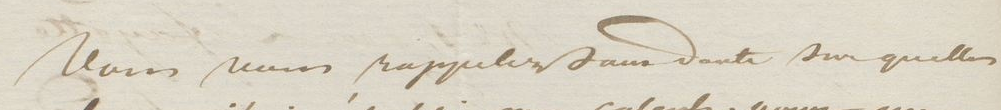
Vous vous rappelez sans doute sur quelles
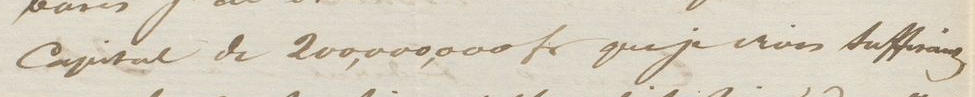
Capital de 200,000,000 fr que je crois suffiront
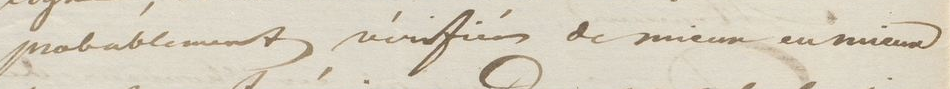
probablement vérifiées de mieux en mieux
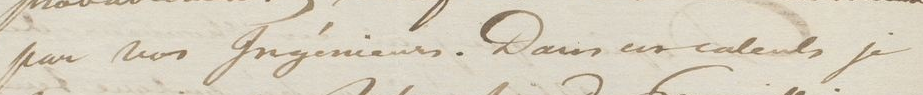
par nos Ingénieurs. Dans ces calculs je
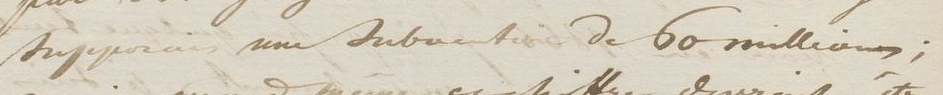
supposais une subvention de 60 millions;
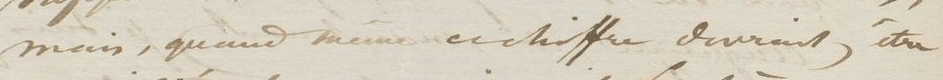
mais, quand même ce chiffre devrait, être
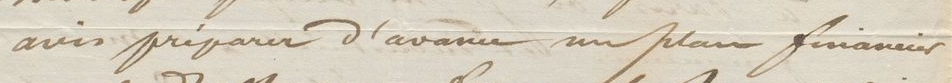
avis préparer d'avance un plan financier
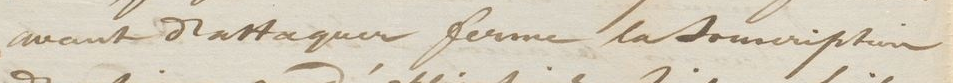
avant d'attaquer ferme la souscription
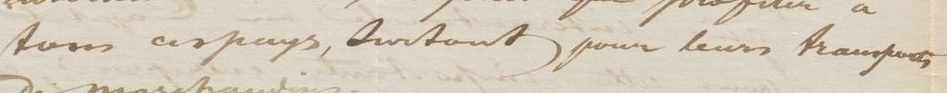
tous ces pays, surtout pour leurs transports
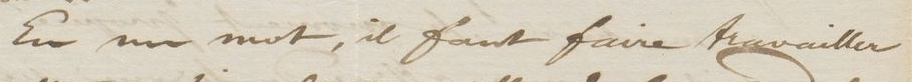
En un mot, il faut faire travailler
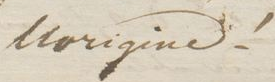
l'origine
